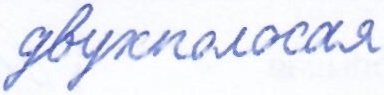двухполосая
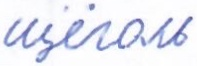щёголь
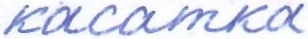касатка
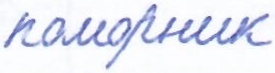поморник
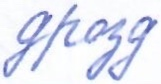дрозд
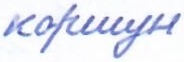коршун
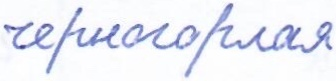черногорлая
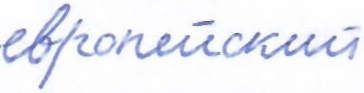европейский
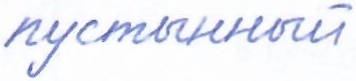пустынный
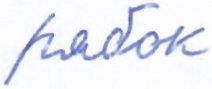рябок
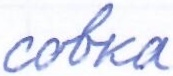совка
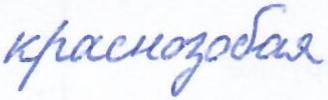краснозобая
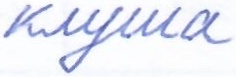клуша
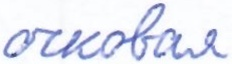очковая
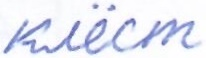клёст
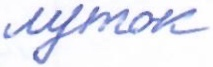луток
